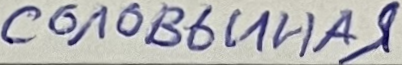соловьиная
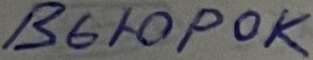вьюрок
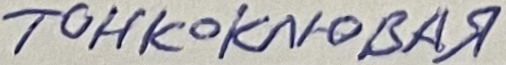тонкоклювая
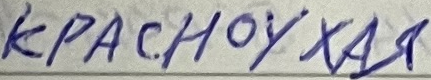красноухая
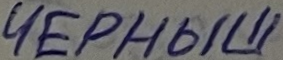черныш
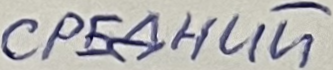средний
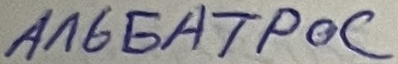альбатрос
